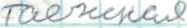таежная
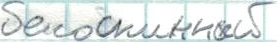белоспинный
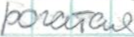рогатая
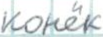конёк
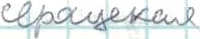серощекая
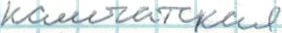камчатская
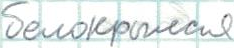белокрылая
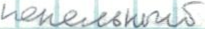пепельный
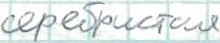серебристая
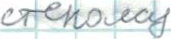стенолаз
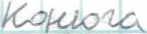конюга
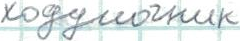ходулочник
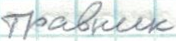травник
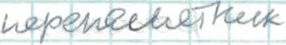перепелятник
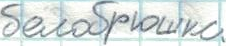белобрюшка
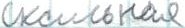скальная
